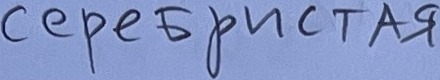серебристая
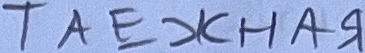таежная
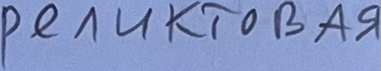реликтовая
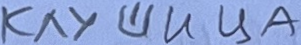клушица
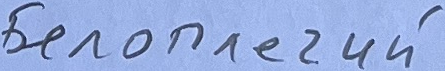белоплечий
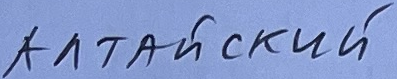алтайский
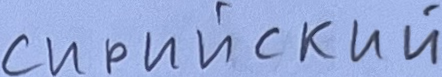сирийский
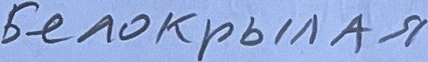белокрылая
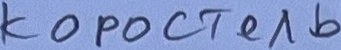коростель
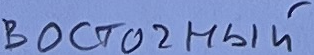восточный
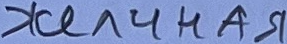желчная
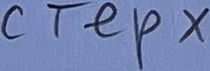стерх
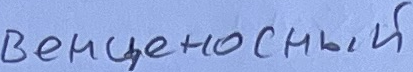венценосный
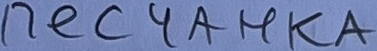песчанка
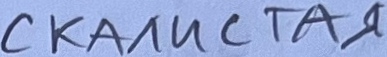скалистая
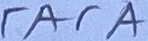гага
